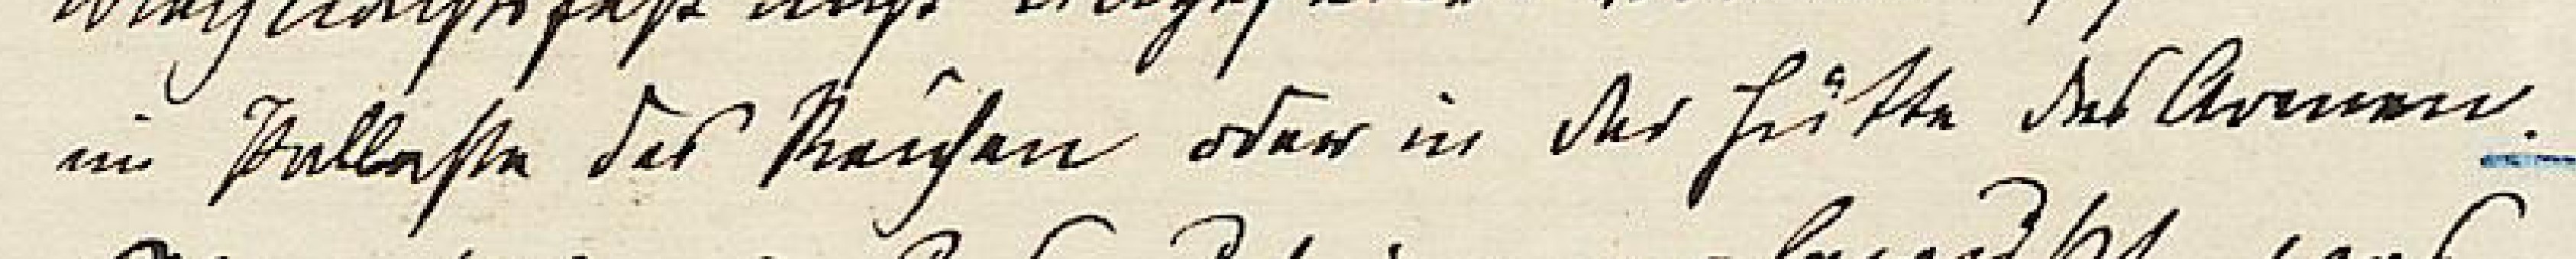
im Pallaste des Renichen oder in der Hütte das Armen
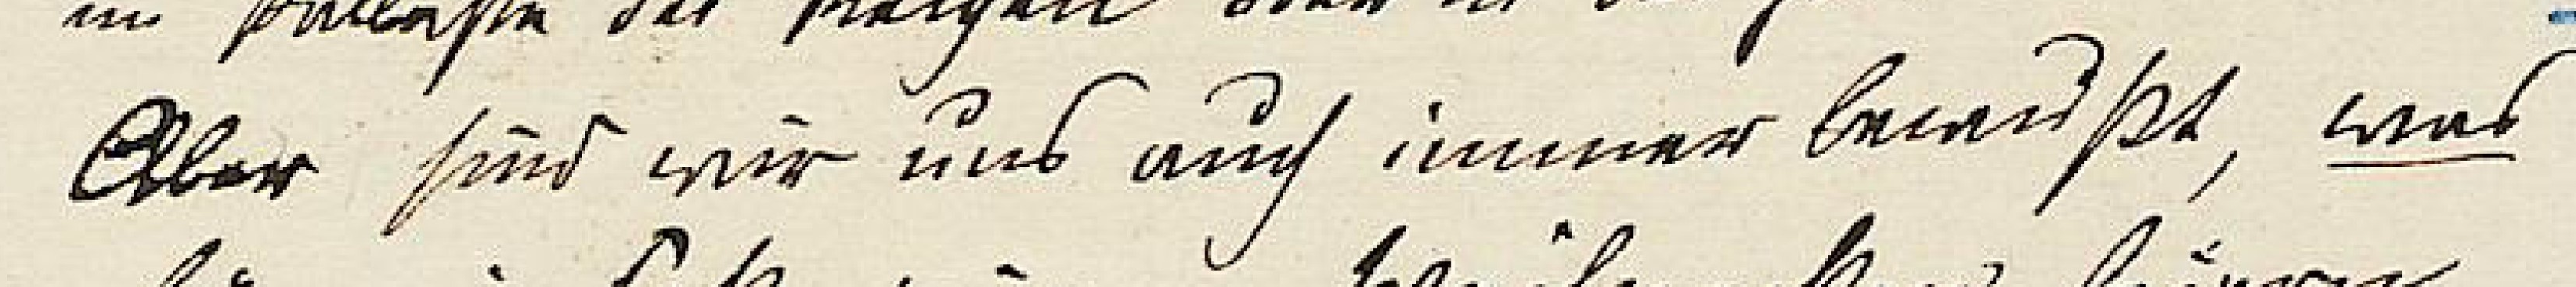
Aber sind wir uns auch inmmer bewußet, was
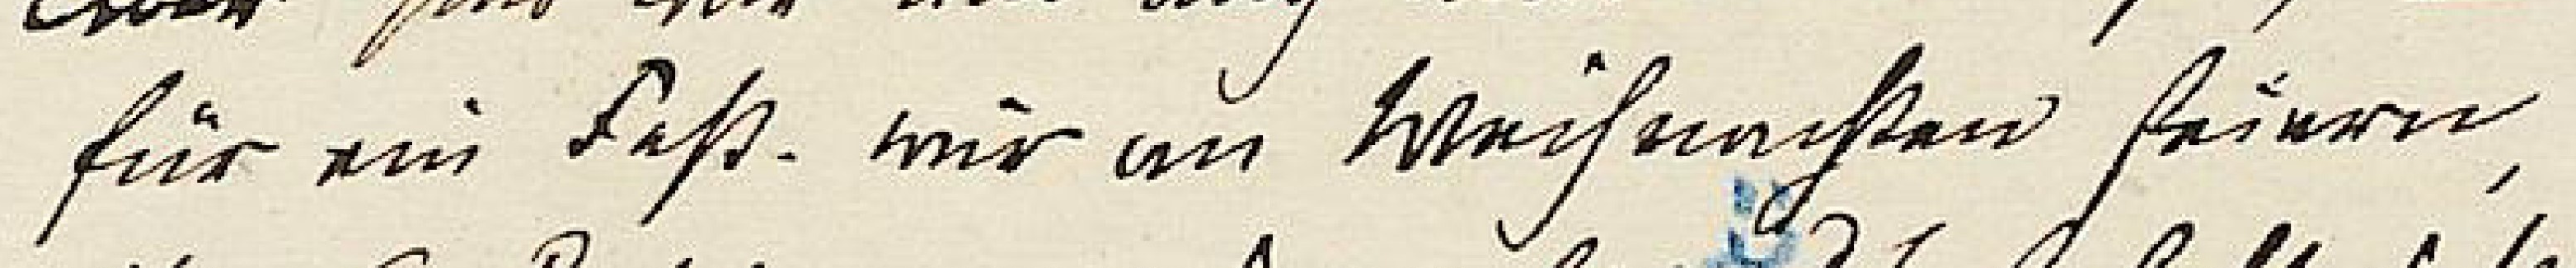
für ein Fest wir an Weihnachten feiern,
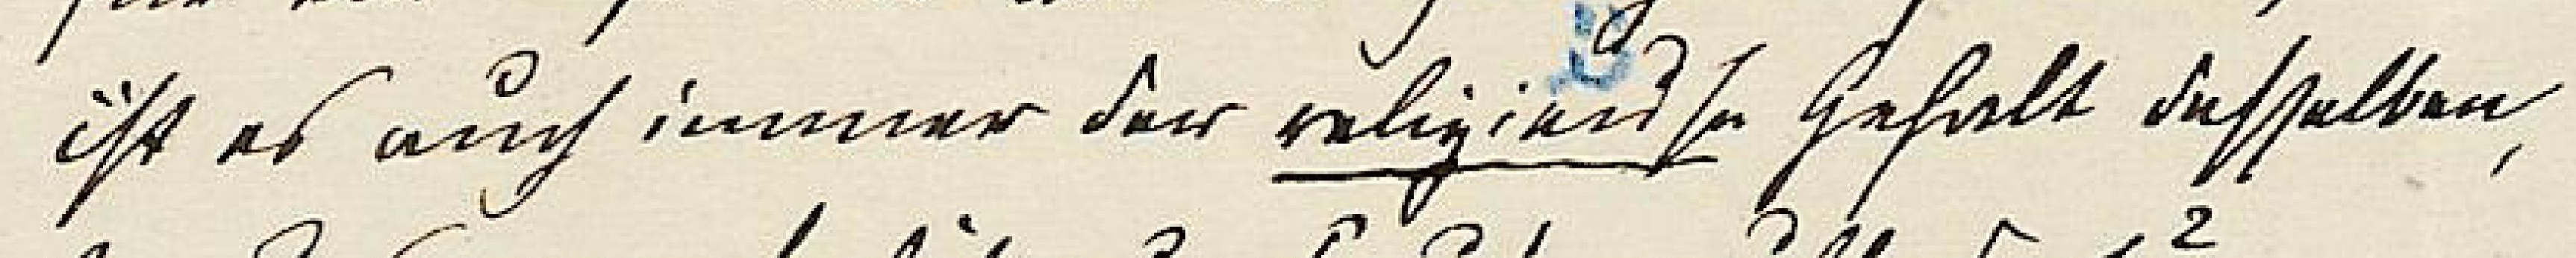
ist es auch immer der religieuse Gehalt desselben,
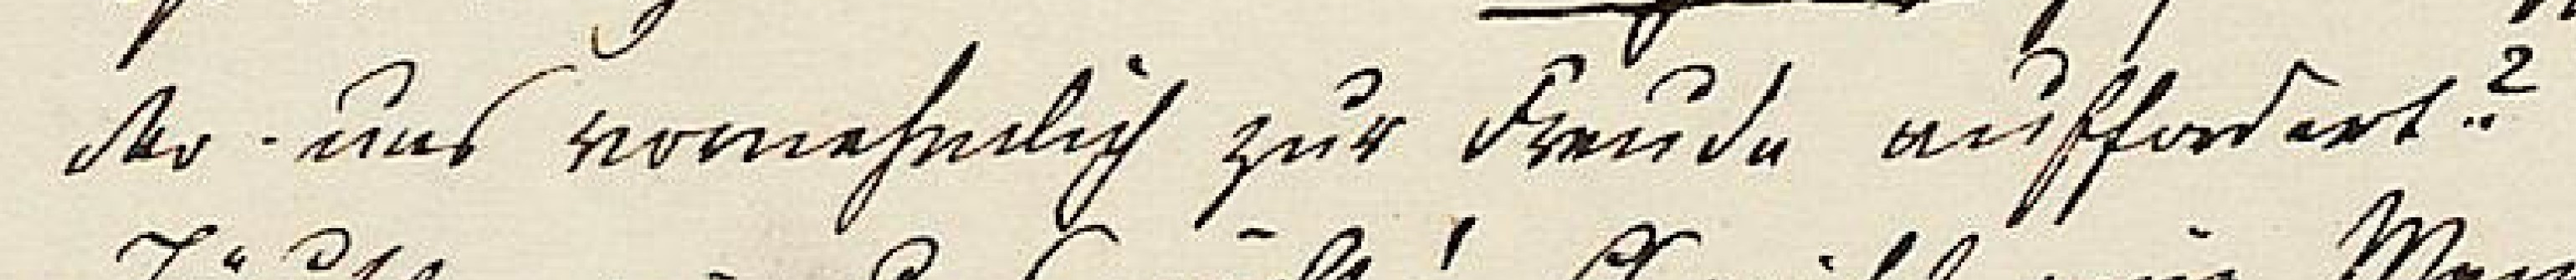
der uns vornehmlich zur Freude auffordert?
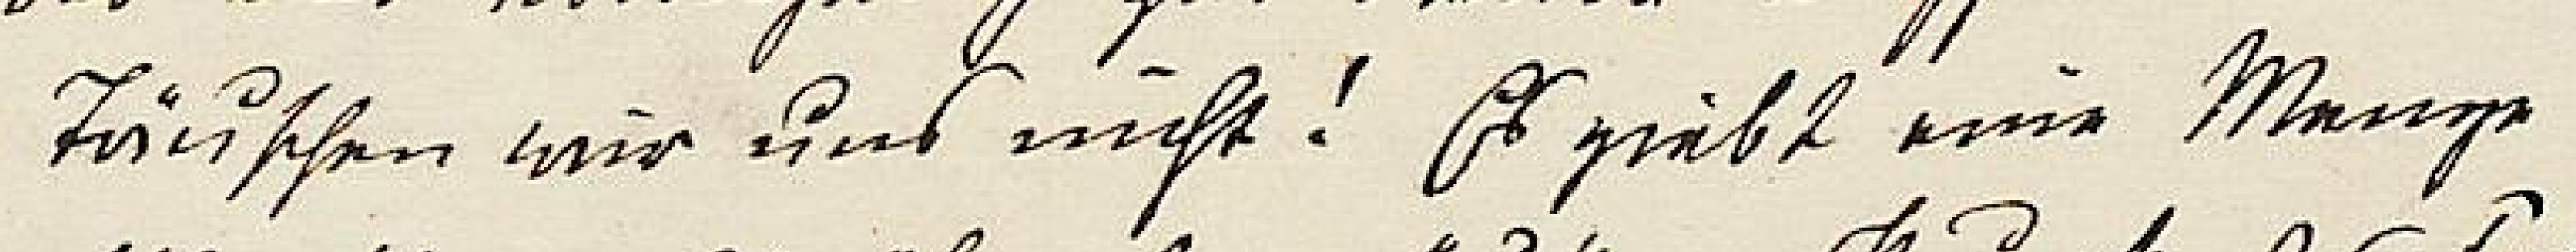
Täuschen wir uns nicht! Es giebt eine Menge
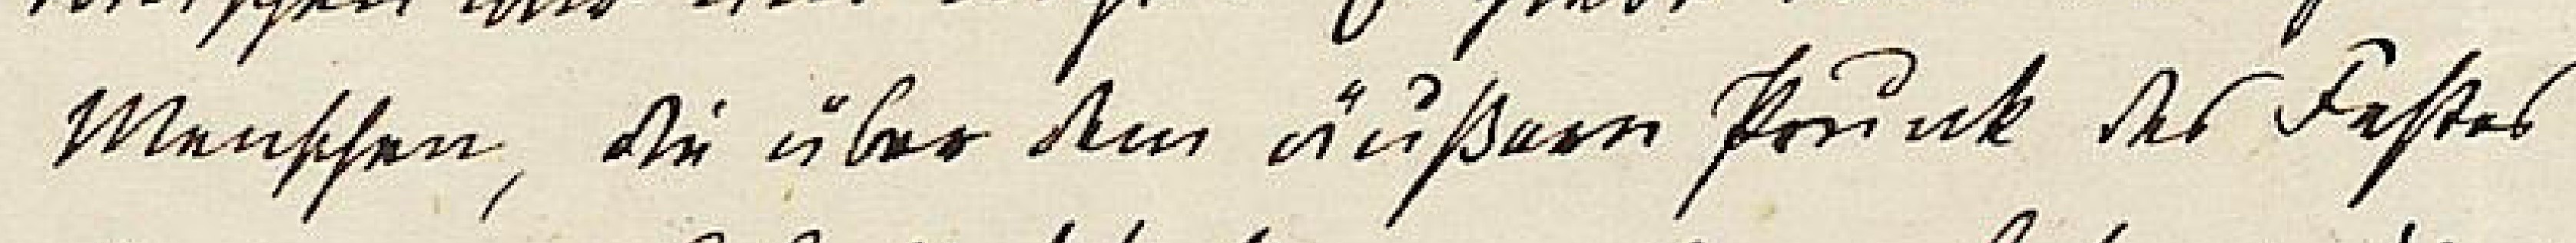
Menschen, die über dem äußern Prunk des Festes
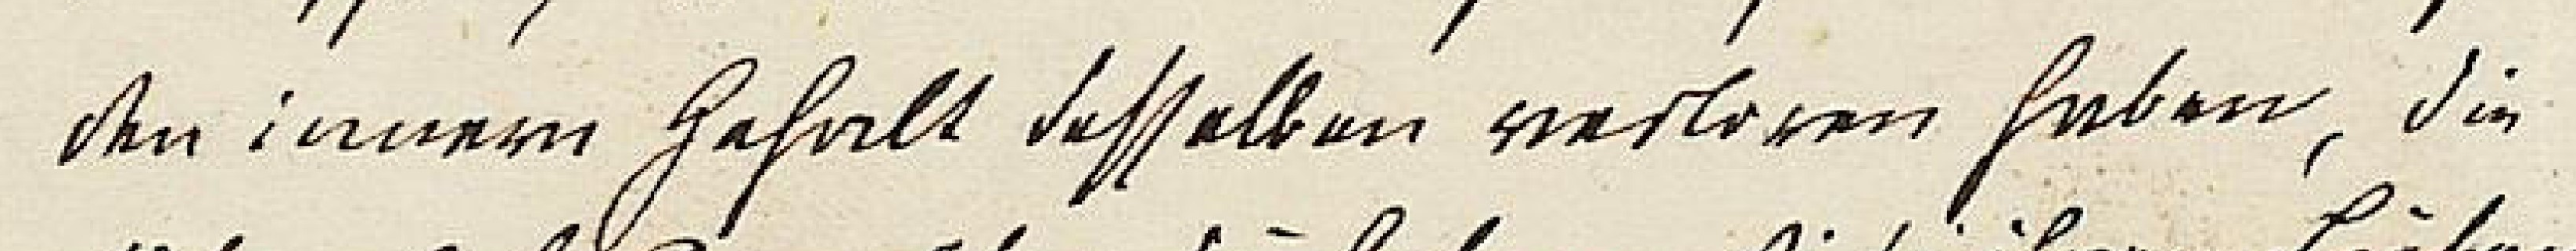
den innern Gehalt desselben verloren haben, die
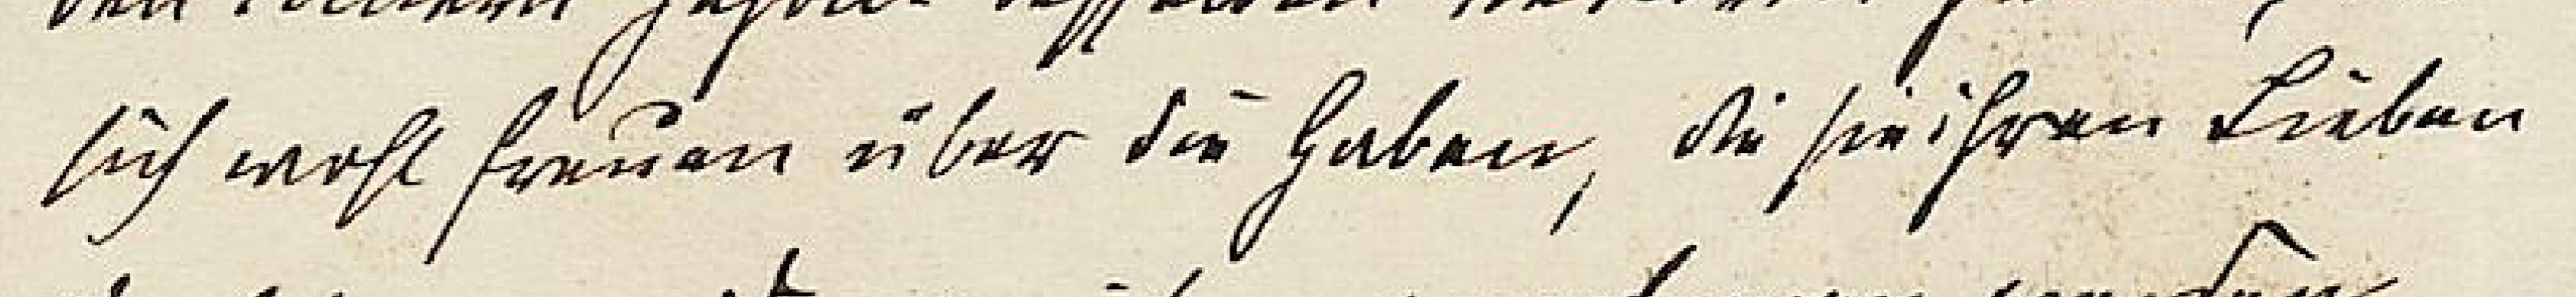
sich wohl freuen über die Gaben, die sie ihren Lieben
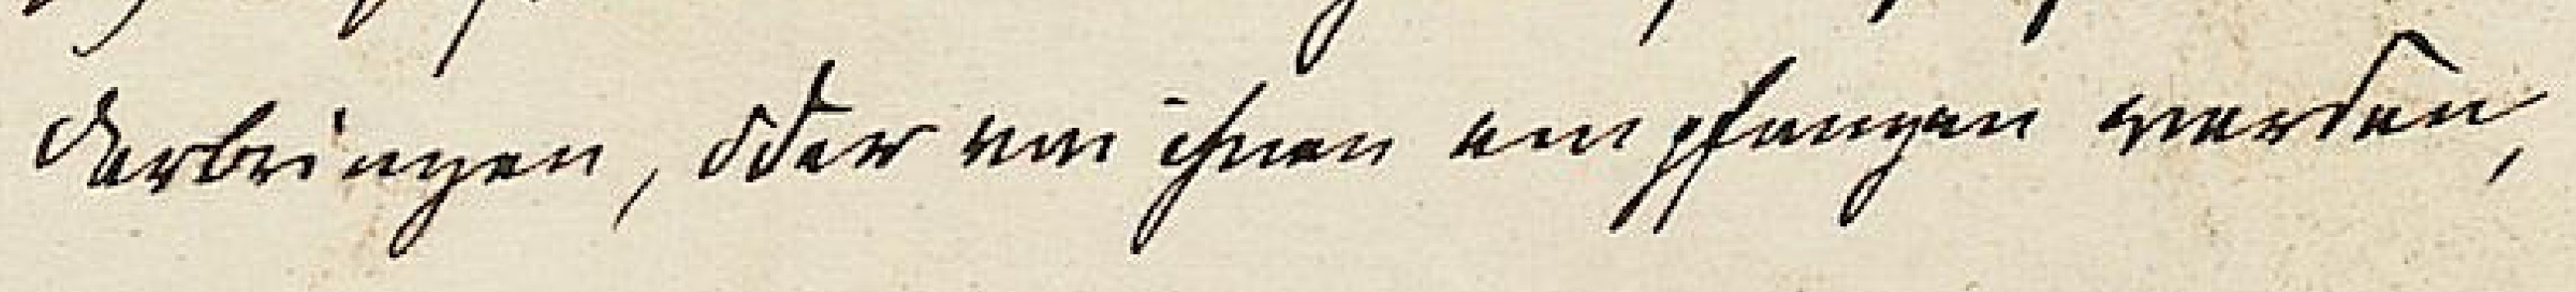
darbringen, oder von ihnen empfangen werden,
